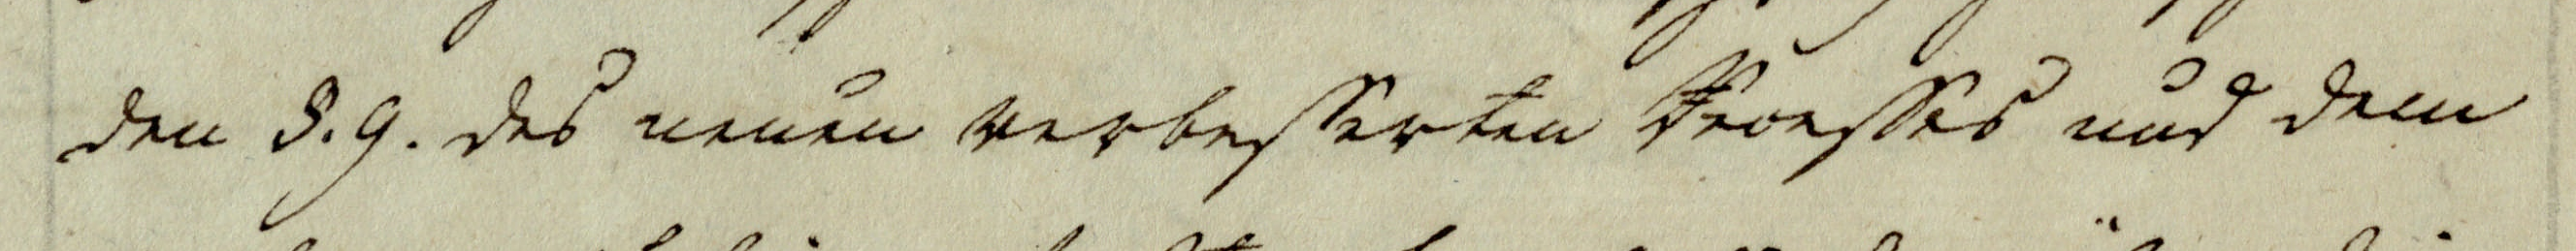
den §. 9. des neuen verbessrten Recesses und dem
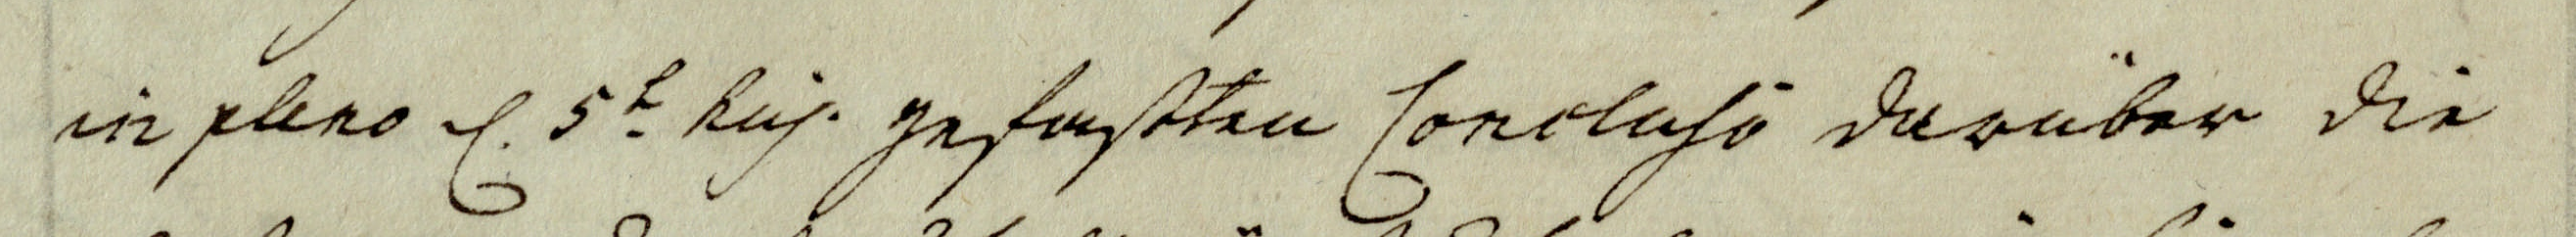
in pleno d. 5 t. huj. gefaßten Concluso darüber die
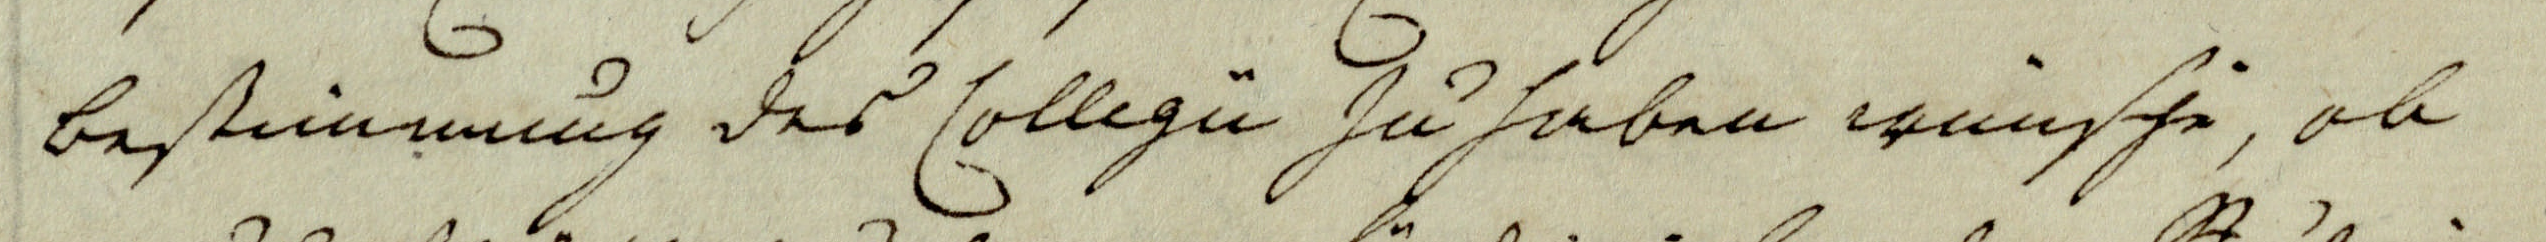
Bestimmung des Collegii zu haben wünsche, ob
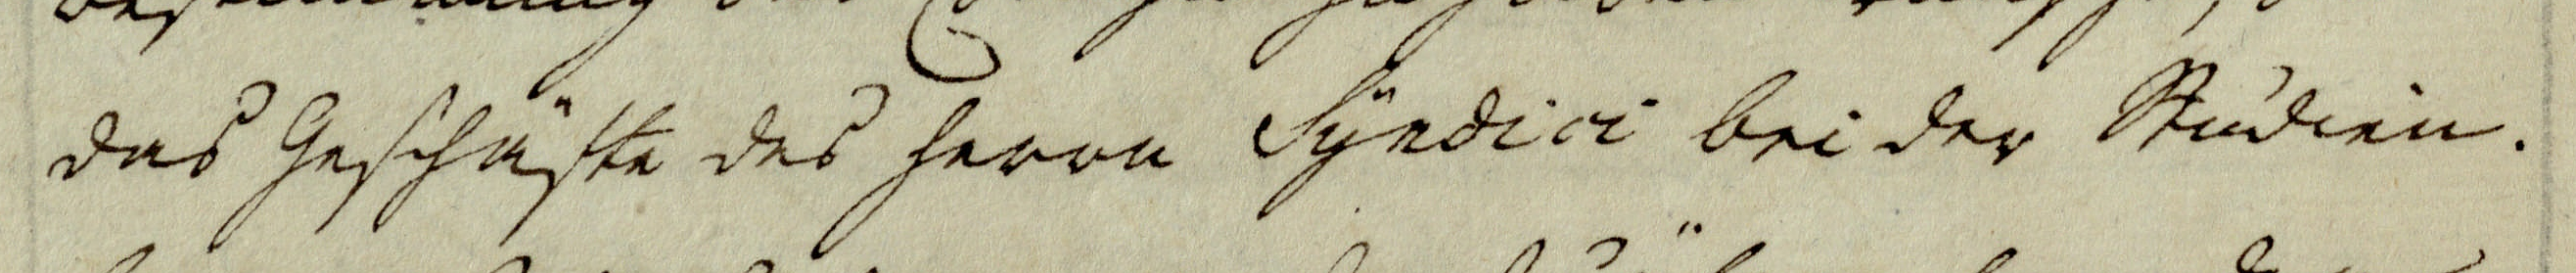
das Geschäfte des Herrn Sÿndici bei der Studien¬
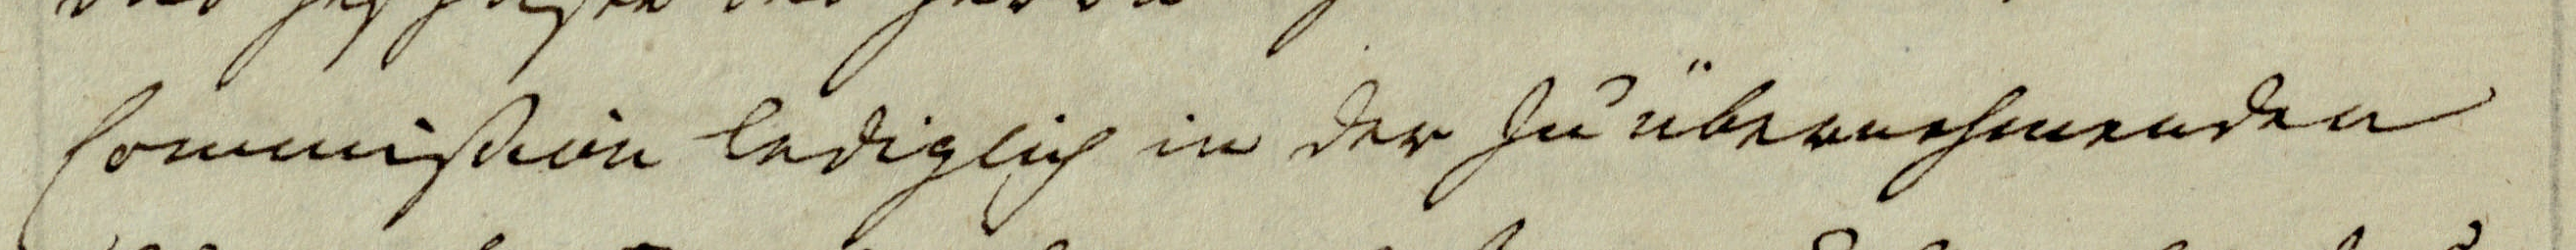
Commission lediglich in der zu ünbernehmenden
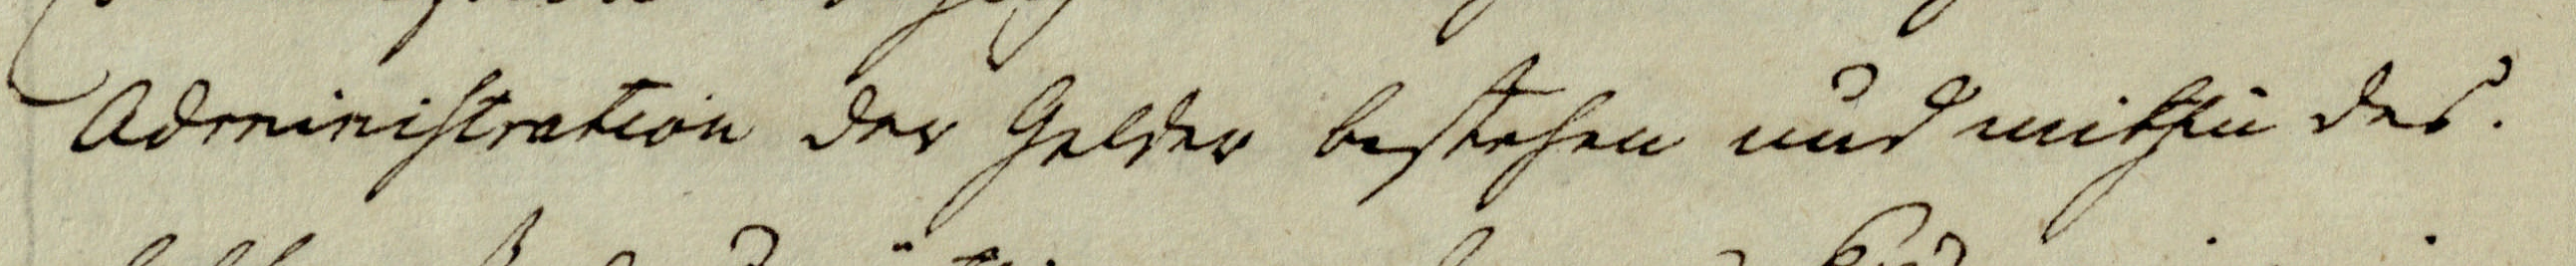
Administration der Gelder bestehen und mithin des¬
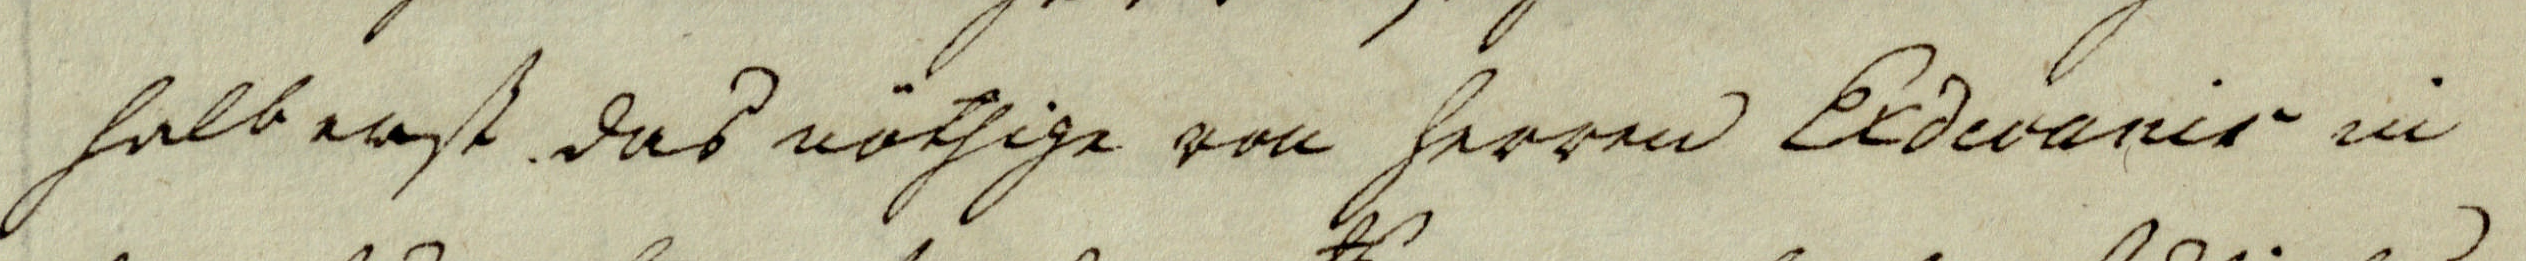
halb erst das nöthige von Herren Exdeoanis in
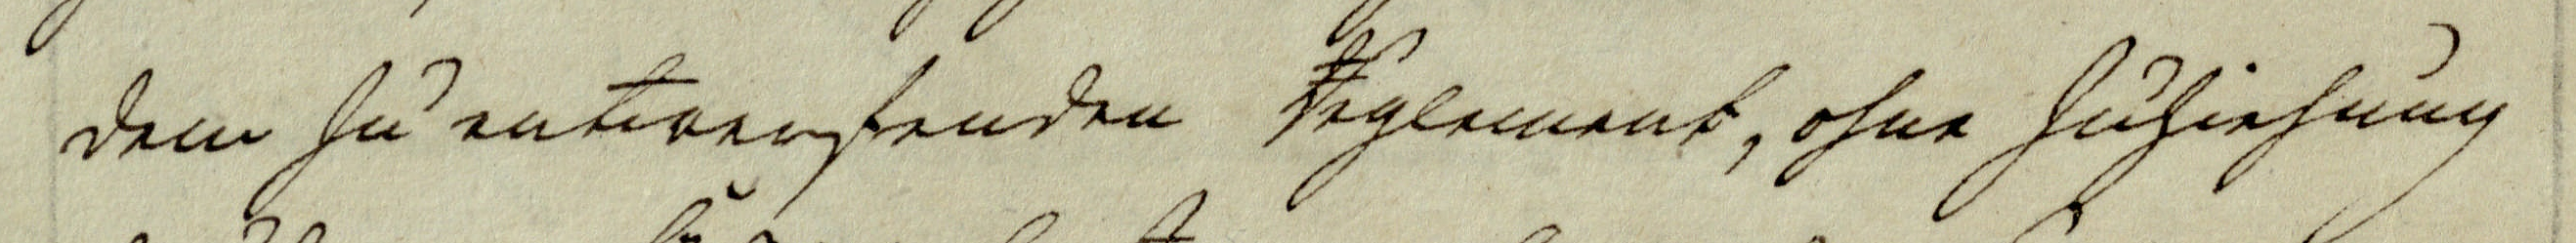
dem zu entwerfenden Reglement, ohne Zuziehung
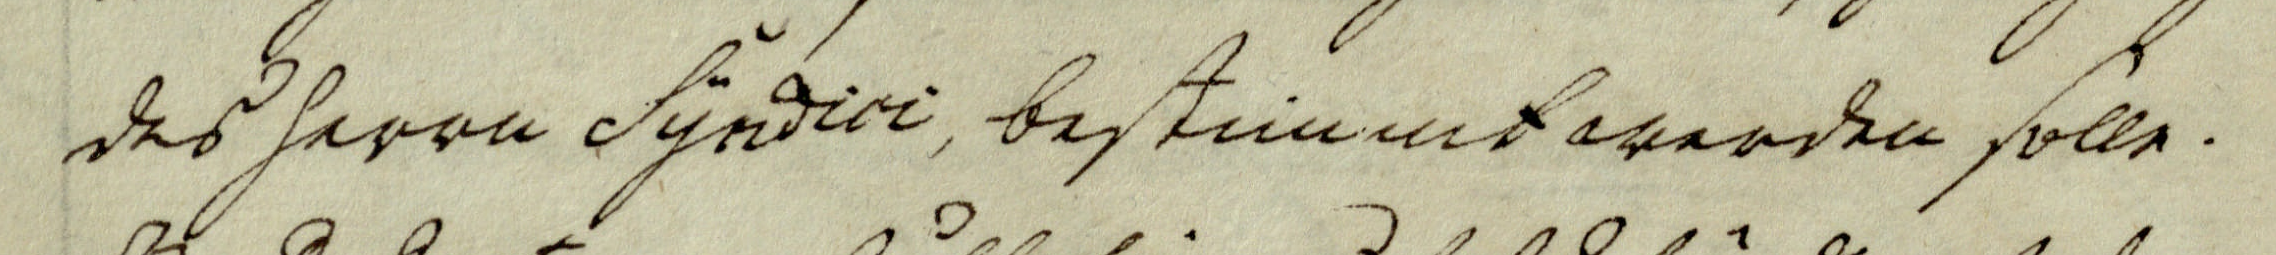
des Herrn Sÿndici, bestimmt werden solle.
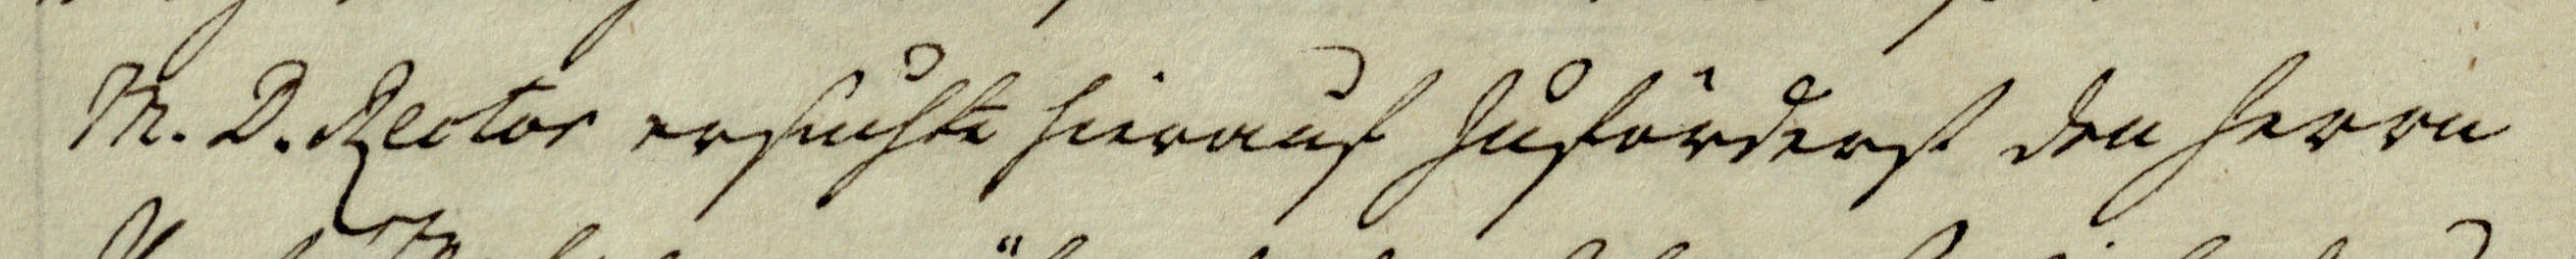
M. D. Rector ersuchte hierauf zuförderst den Herrn
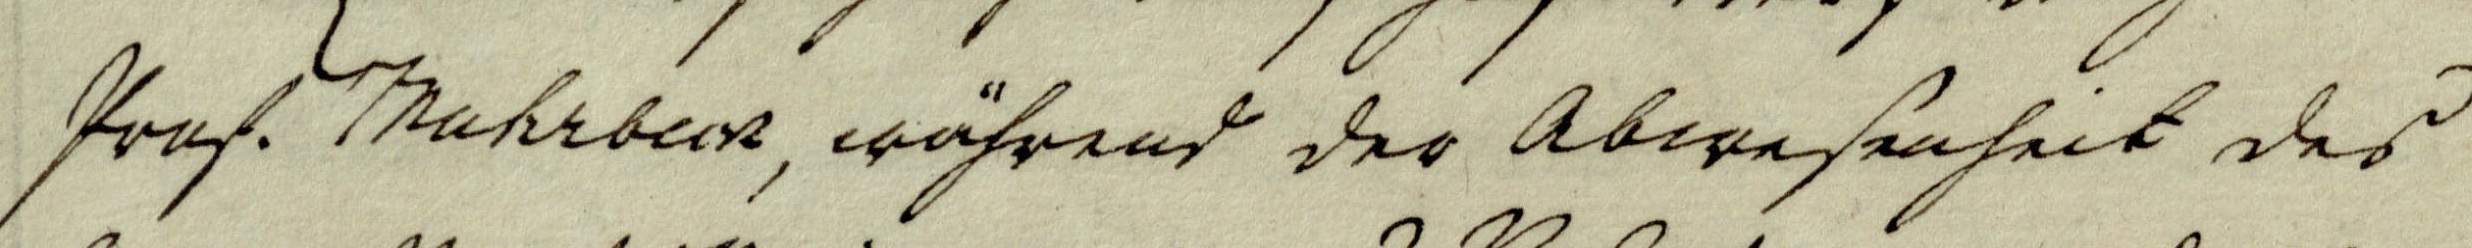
Prof. Muhrbeck, während der Abwesenheit des
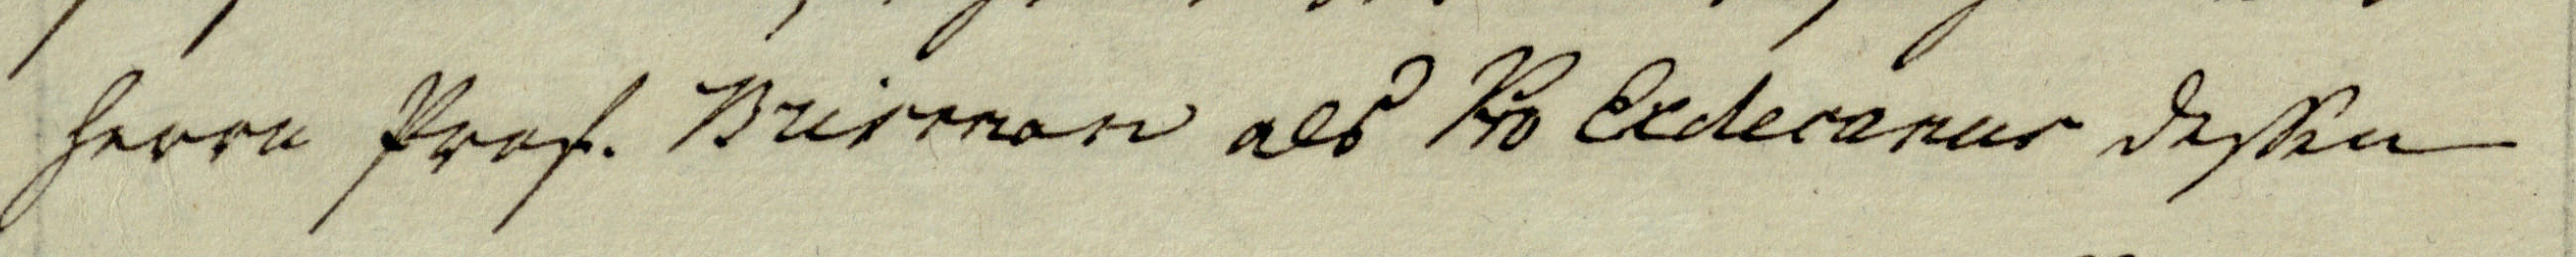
Herrn Prof. Brisman als Pro Exdecanus dessen
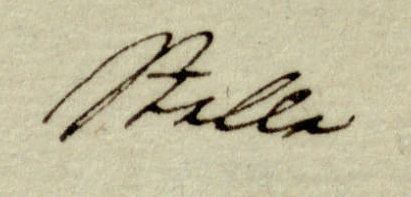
Stelle
